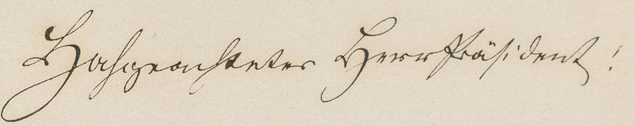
Hochgeachteter Herr Präsident!
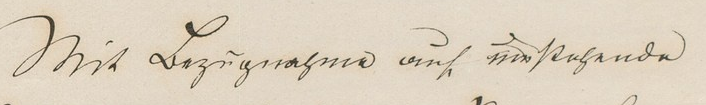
Mit Bezugnahme auf anstehende
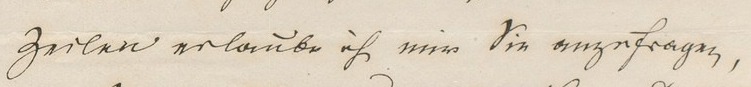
Zeilen erlaube ich mir Sie anzufragen,
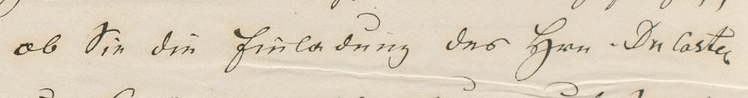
ob Sie die Einladung des Hrn. Du Coster
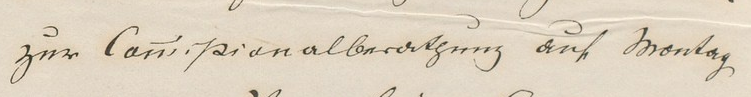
zur Commißionalberathung auf Montag
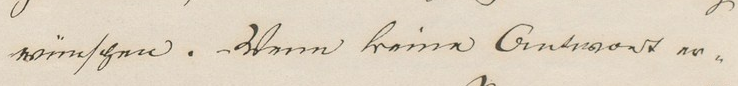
wünschen. Wenn keine Antwort er-
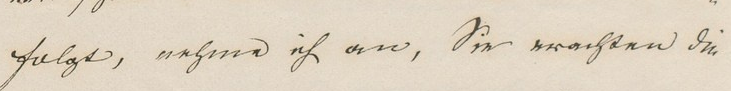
folgt, nehme ich an, Sie erachten die
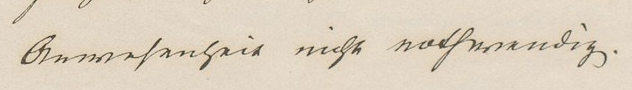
Anwesenheit nicht nothwendig.
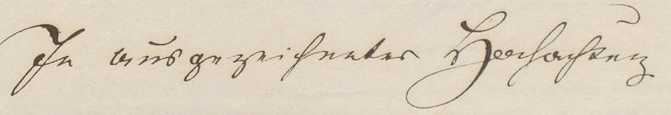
In ausgezeichneter Hochachtung
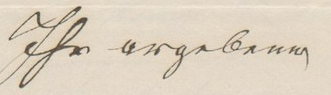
Ihr ergebener
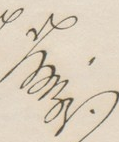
68.
